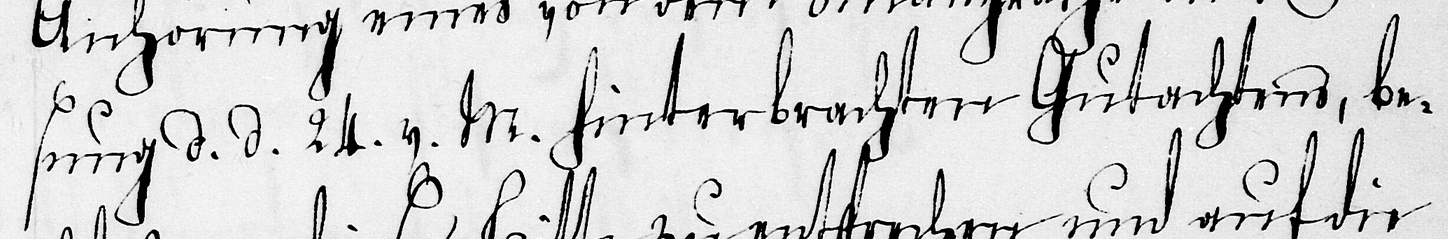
sung d. d. 24. v. M. hinterbrachten Gutachtens, be¬
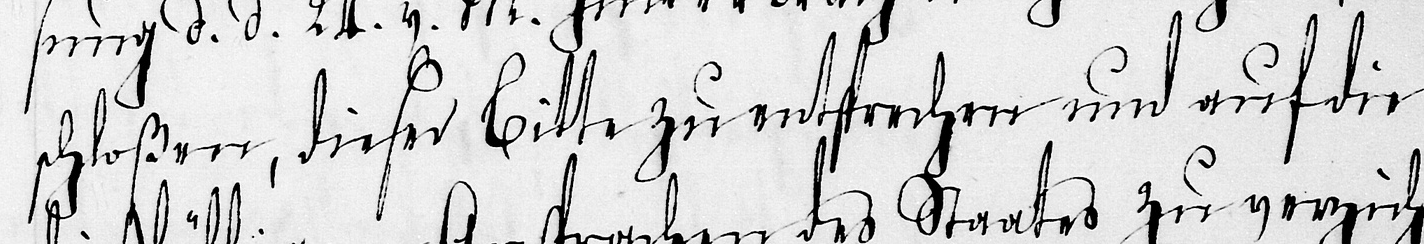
schloßen, dieser Bitte zu entsprechen und auf die
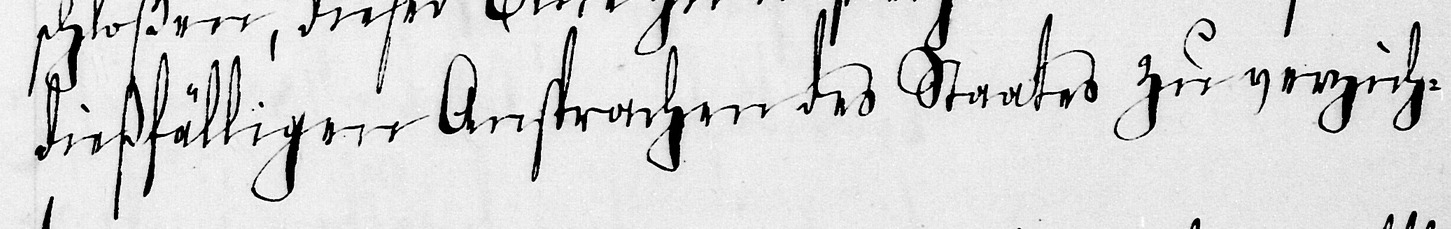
dießfälligen Ansprachen des Staates zu verzich¬
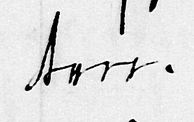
ten.
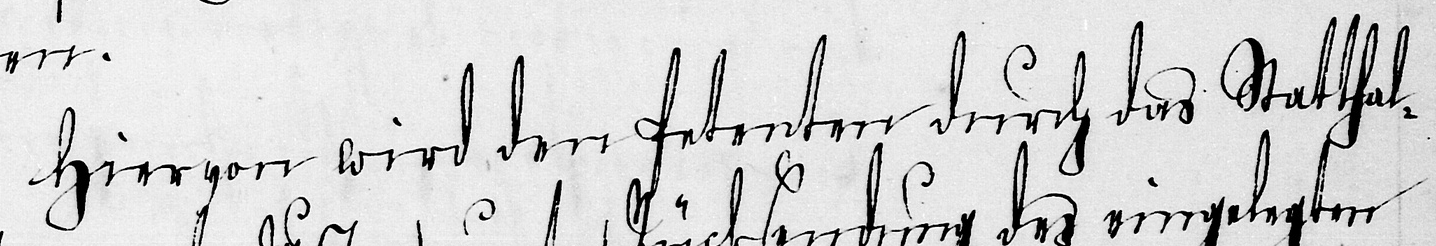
Hiervon wird den Petenten durch das Stattha¬
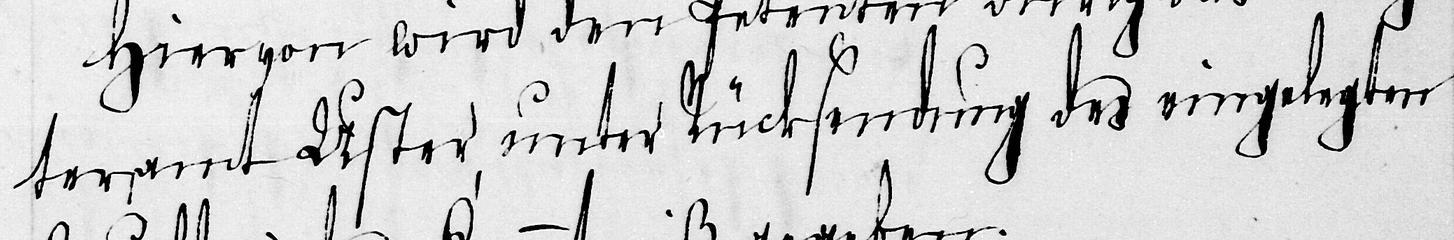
lteramt Uster, unter Rücksendung des eingelegten
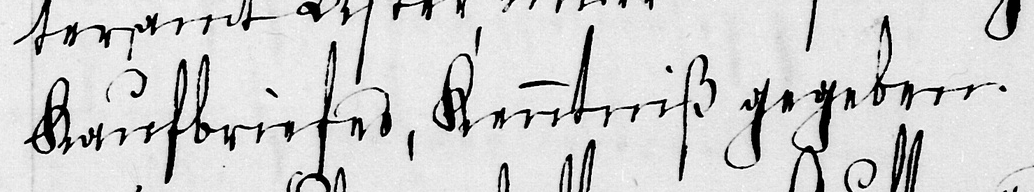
Kaufbriefes, Kenntniß gegeben.
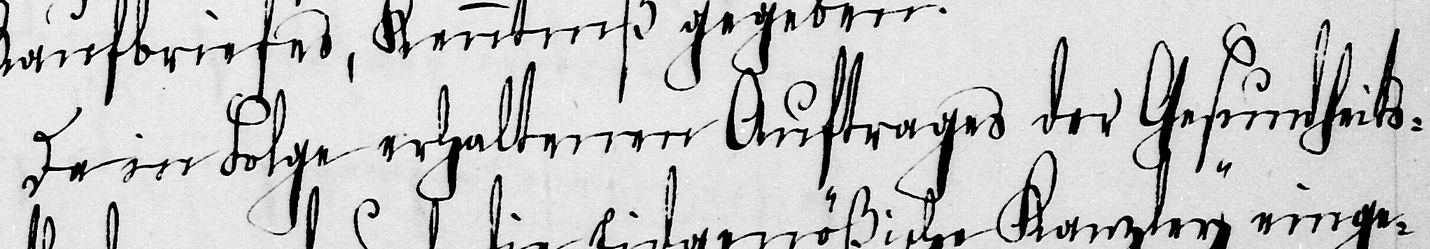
Da in Folge erhaltenen Auftrages der Gesundheits¬
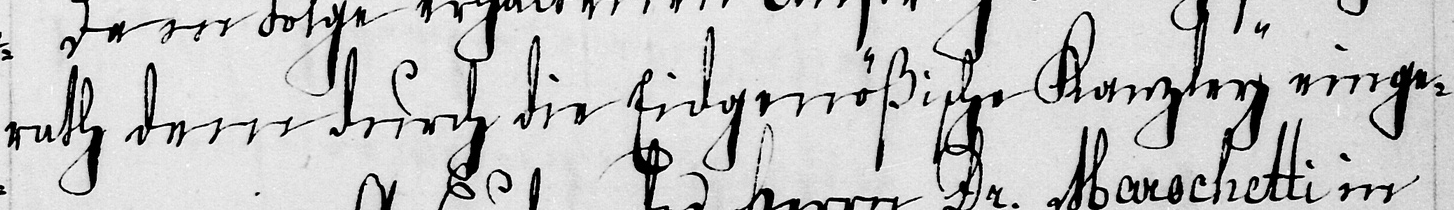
rath dem durch die Eidgenößische Kanzley einge¬
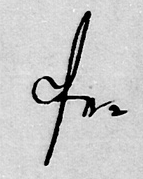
ge¬
